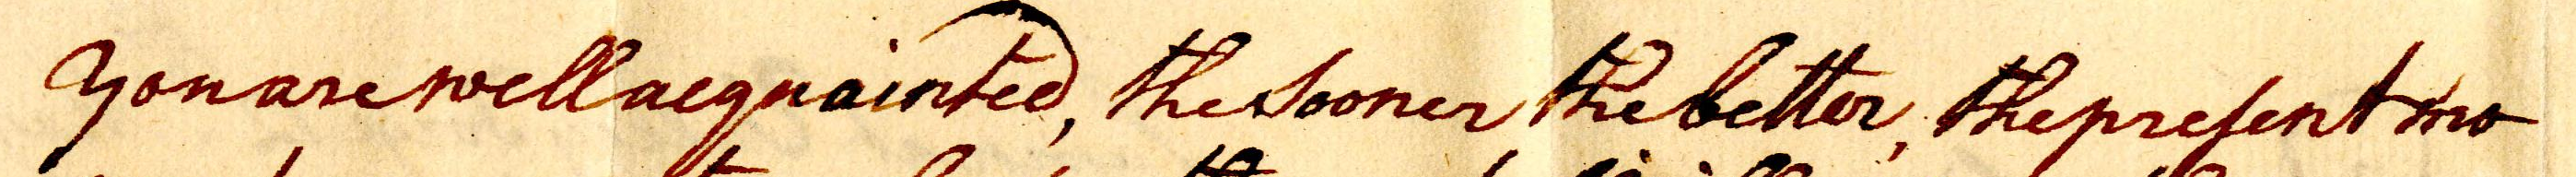You are well acquainted, the Sooner the better, the present mo
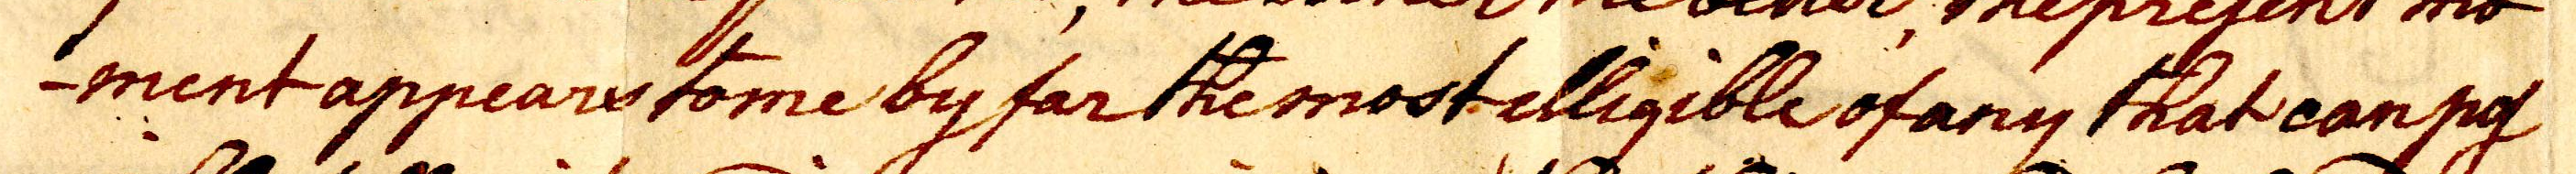-ment appears to me by far the most elligible of any that can pos
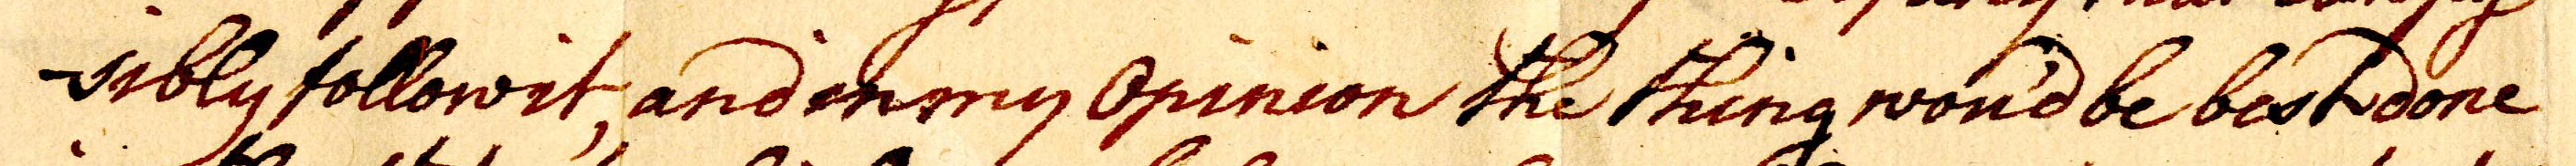-sibly follow it and in my Opinion the thing wou'd be best done
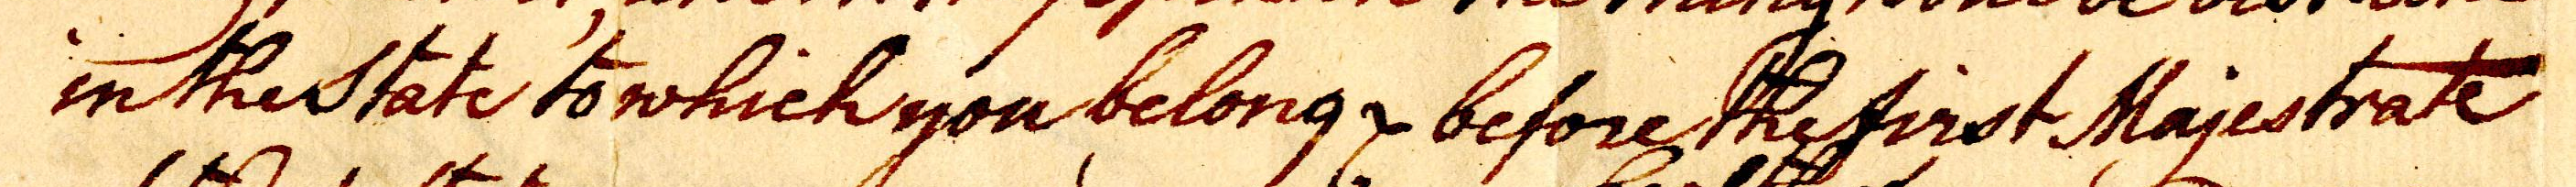in the State to which you belong & before the first Majestrate
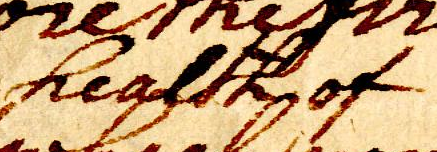health of
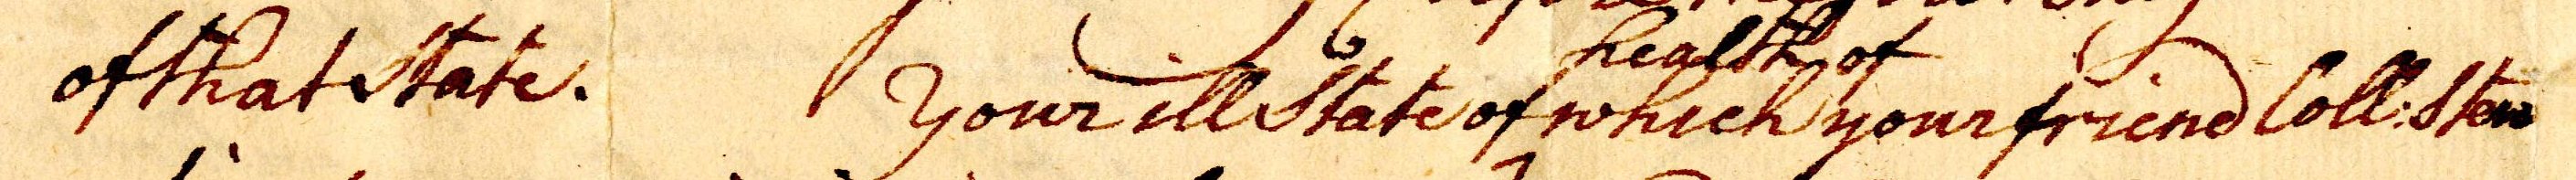of that state. Your ill state of ^ which your friend Coll. Stew
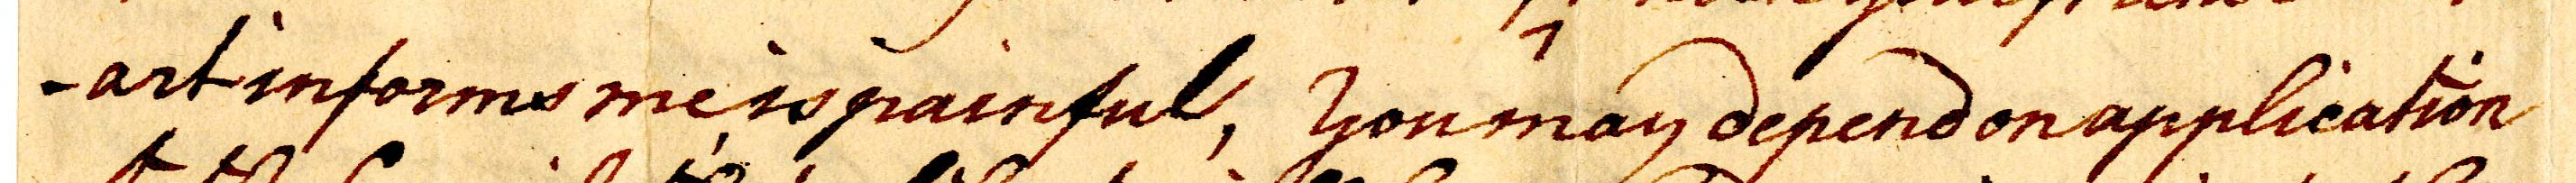-art informs me is painful, You may depend on application
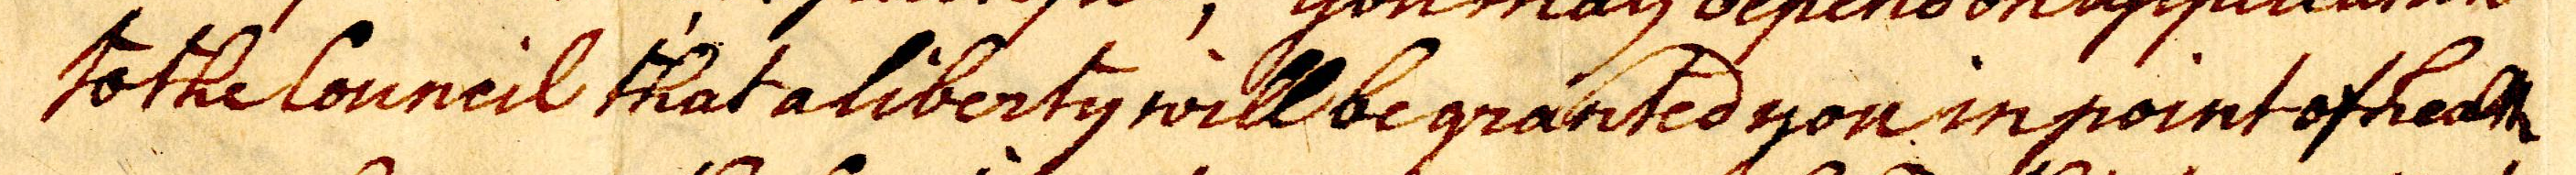to the Council that a liberty will be granted you in point of health
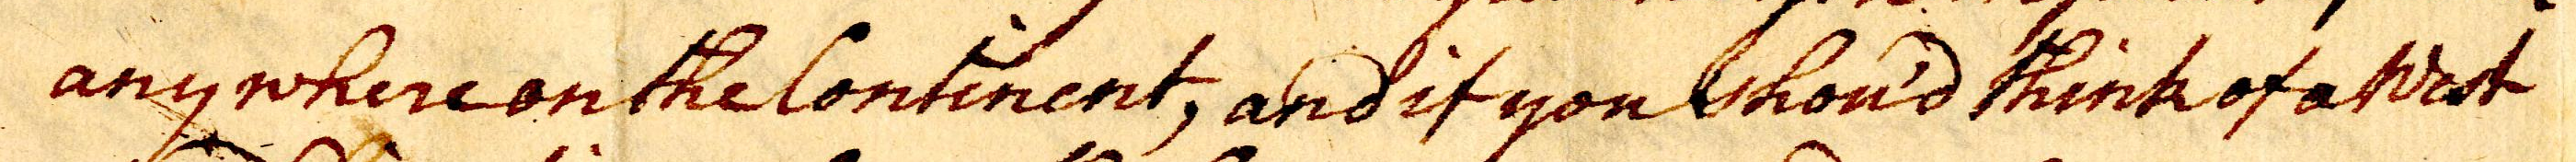any where on the Continent, and if you shou'd think of a West
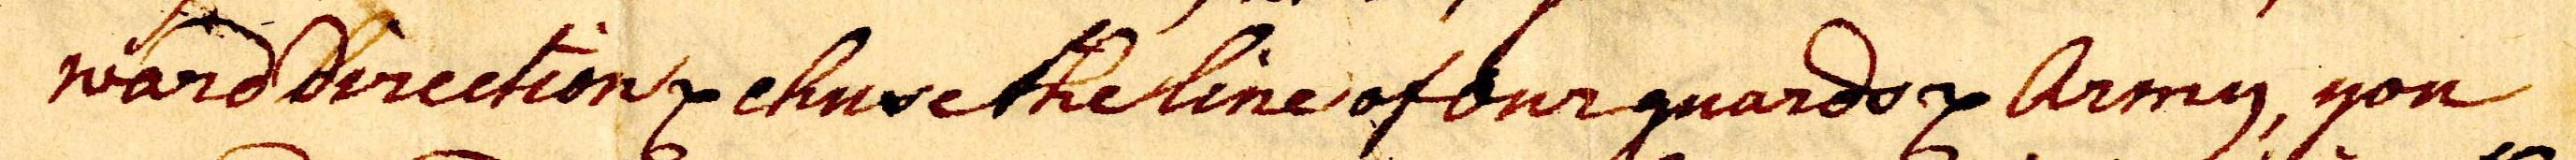ward Direction & chuse the line of our guards & Army, you
